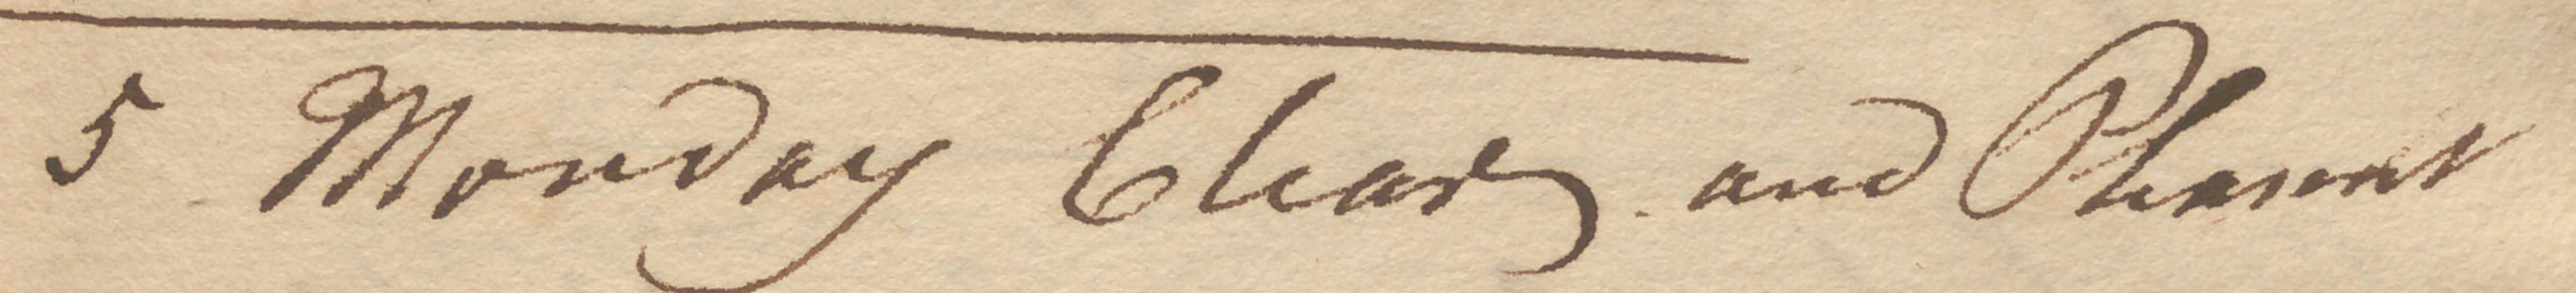5 Monday Clear and Pleasent
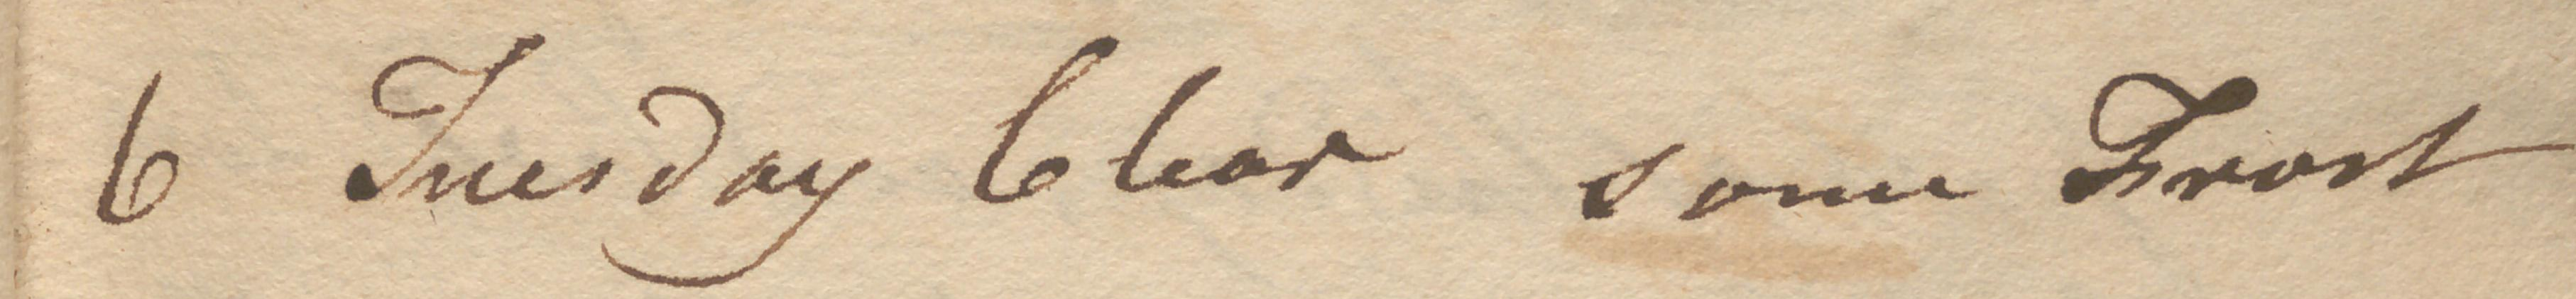6 Tuesday Clear some Frost
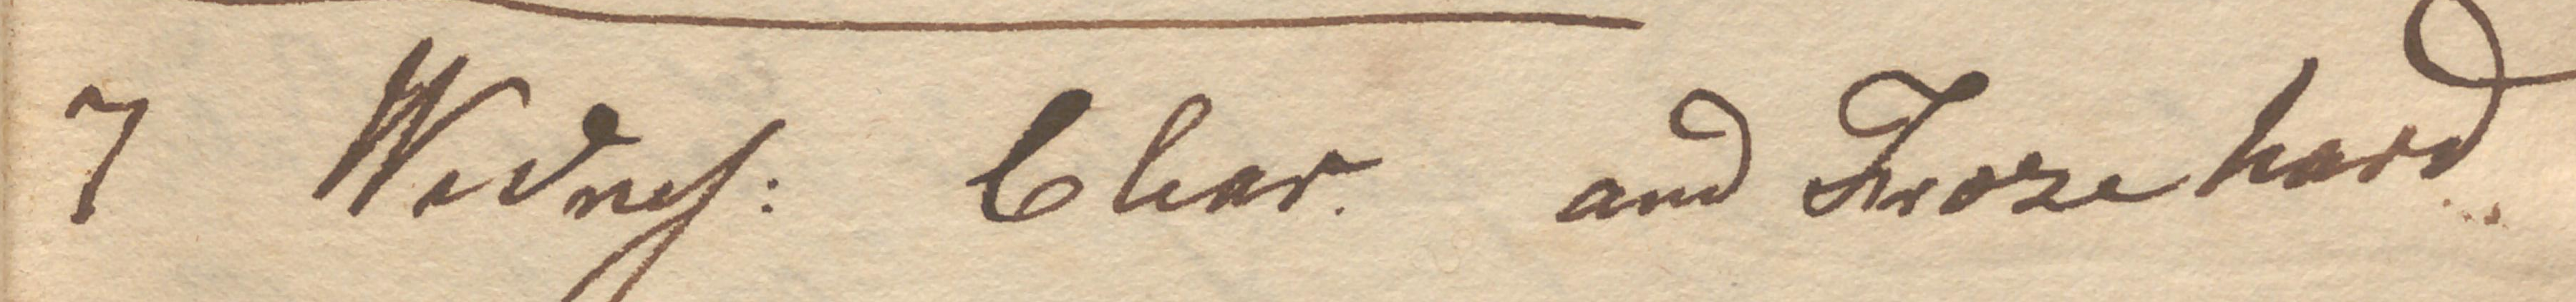7 Wednes. Clear and Froze hard
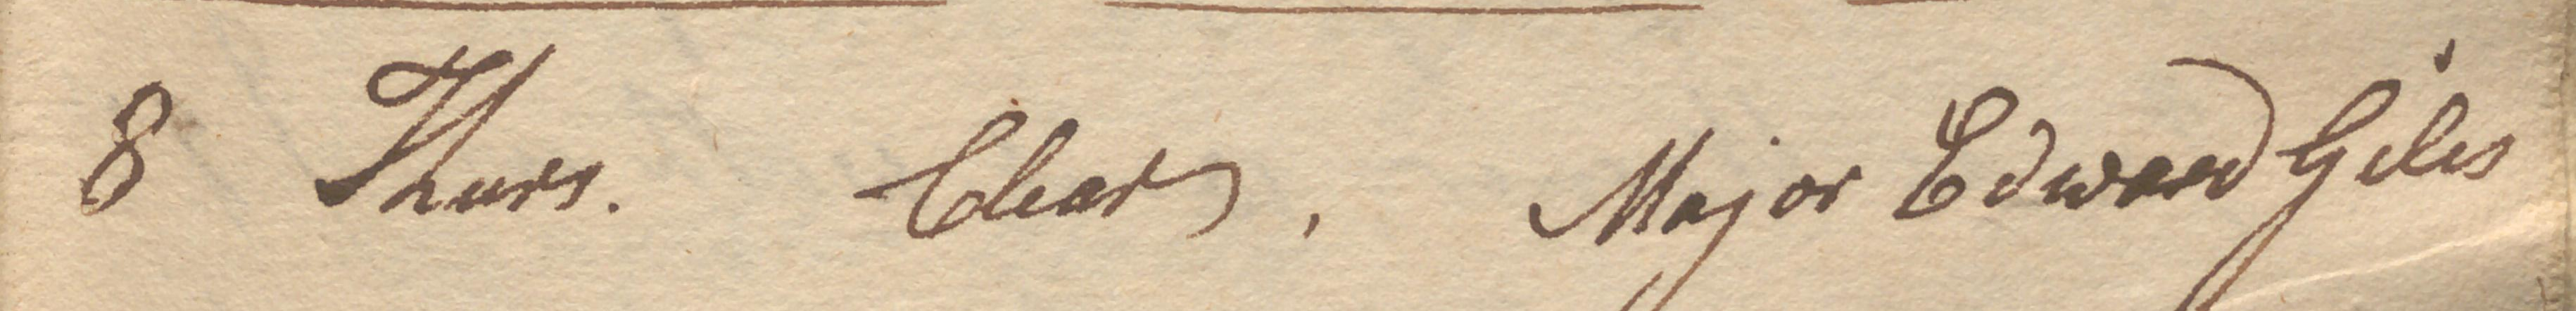8 Thurs. Clear, Major Edward Giles
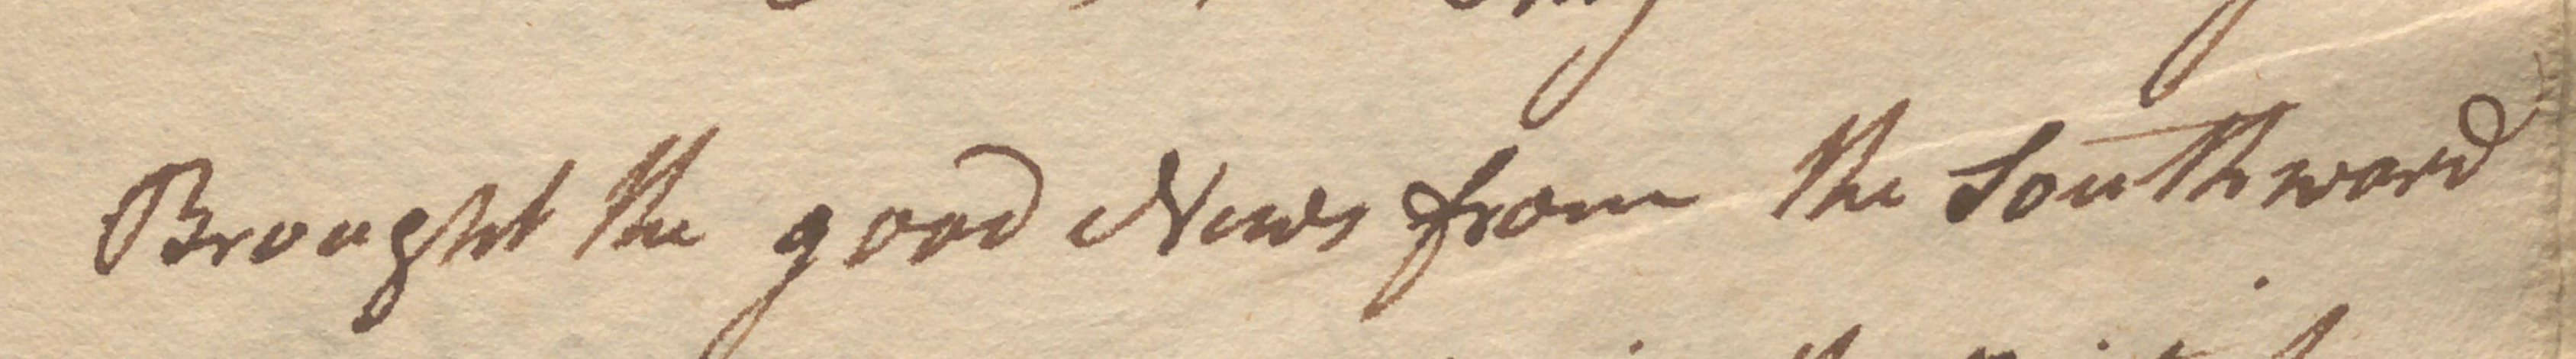Brought the good News from the South ward
